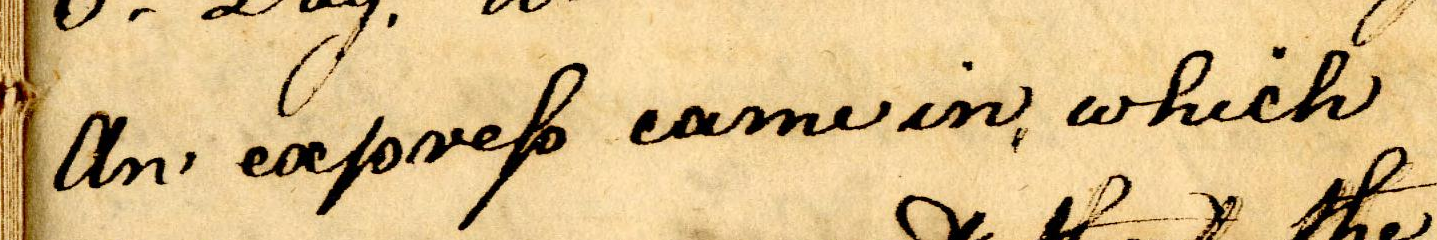An express came in, which
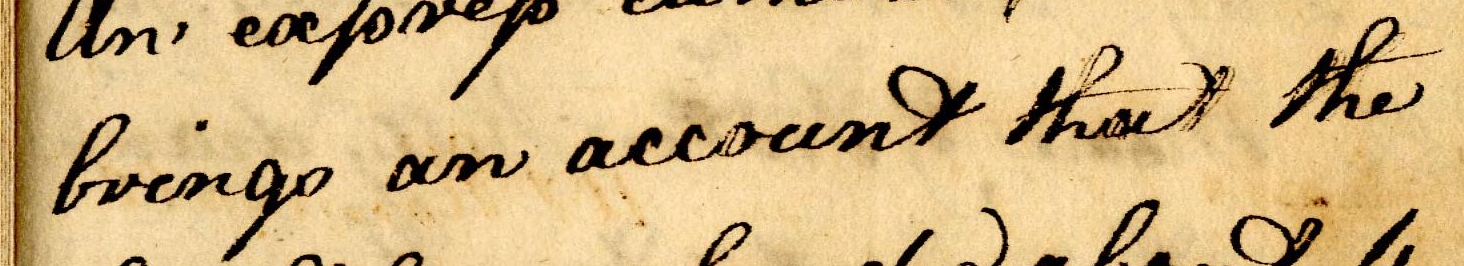brings an account that the
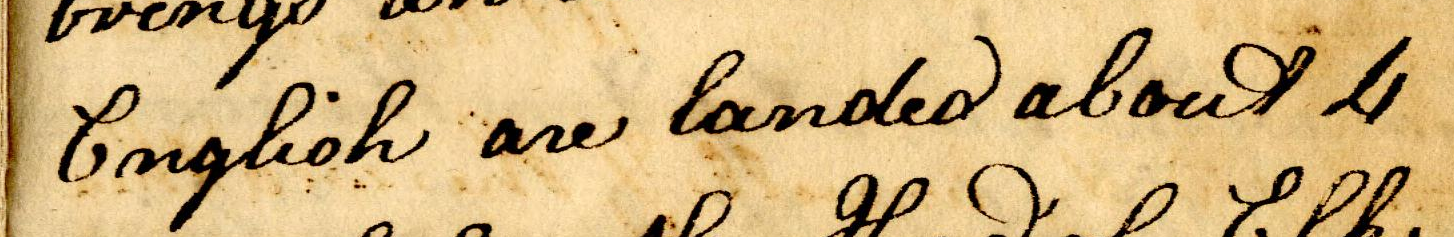English are landed about 4
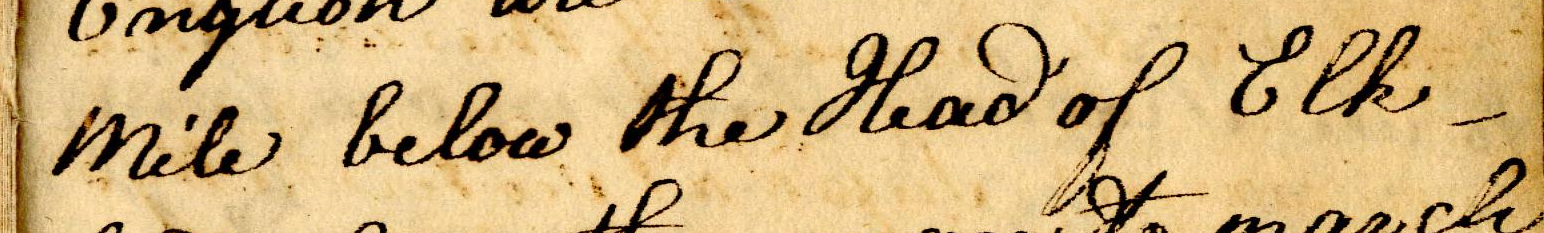Mile below the Head of Elk-
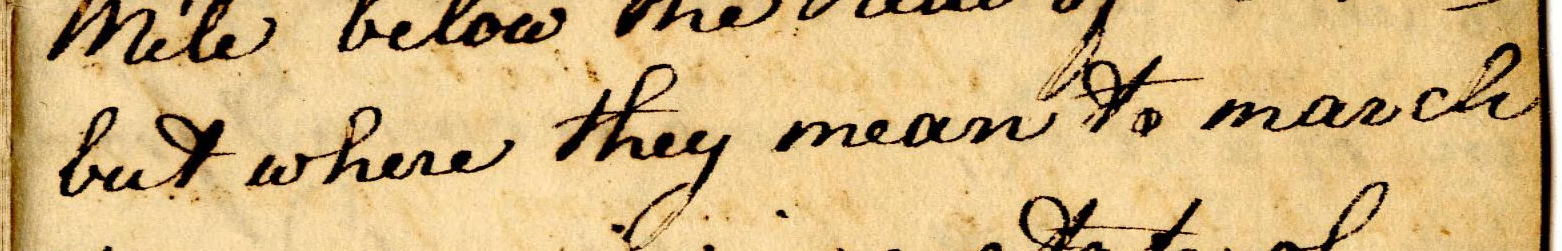but where they mean to march
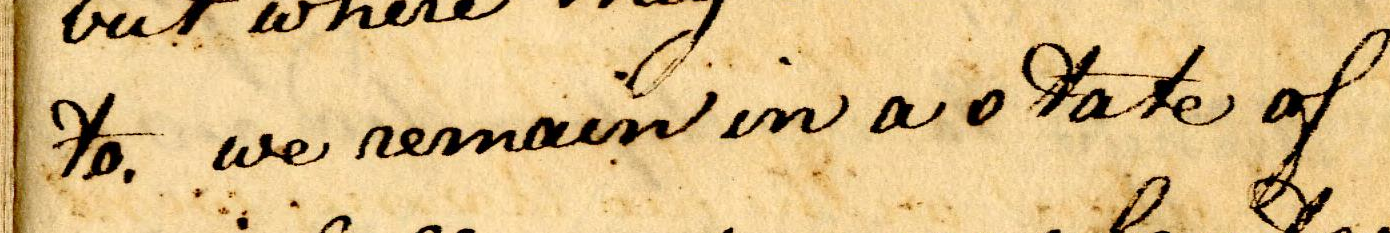to. we remain in a state of
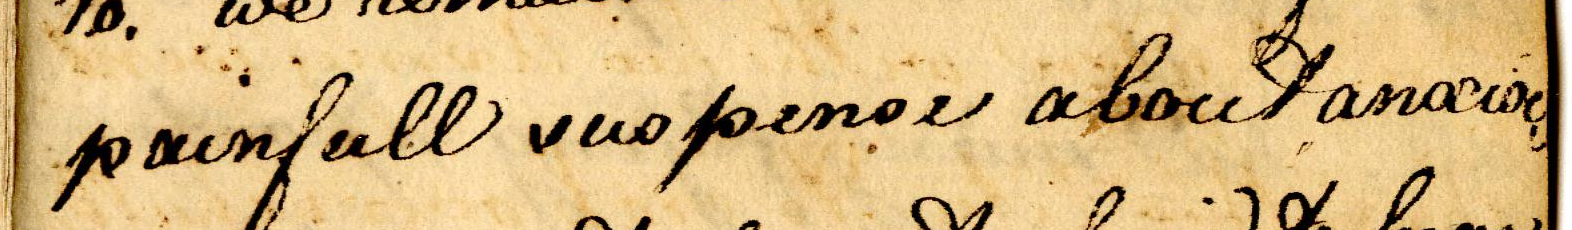painfull suspense about anxious
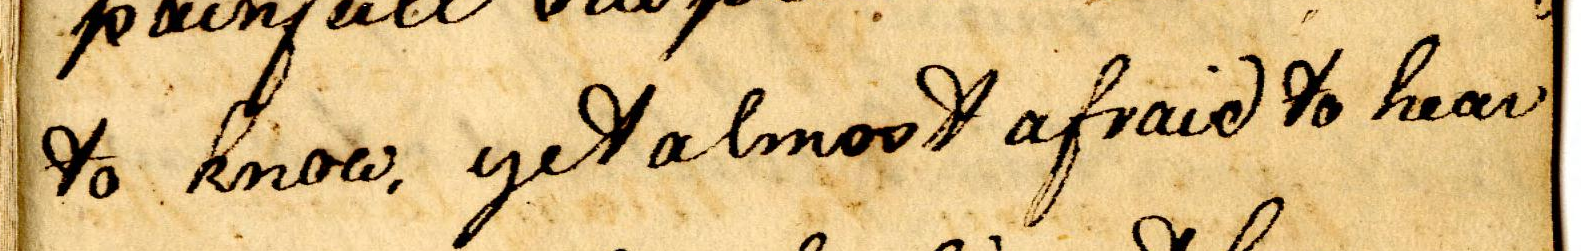to know, yet almost afraid to hear
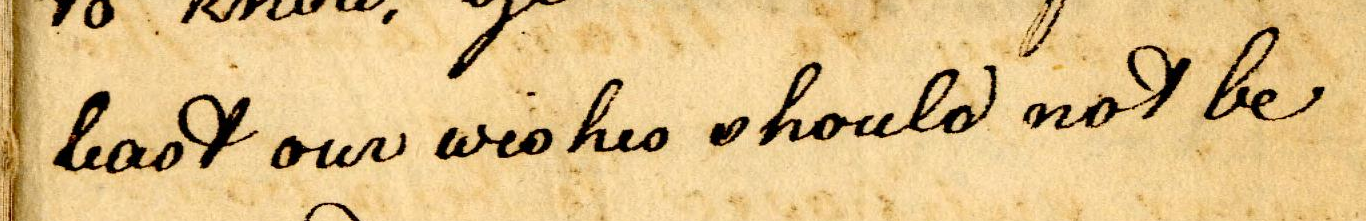least our wishes should not be
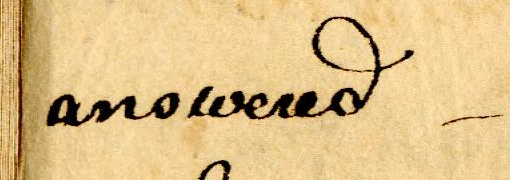answered-
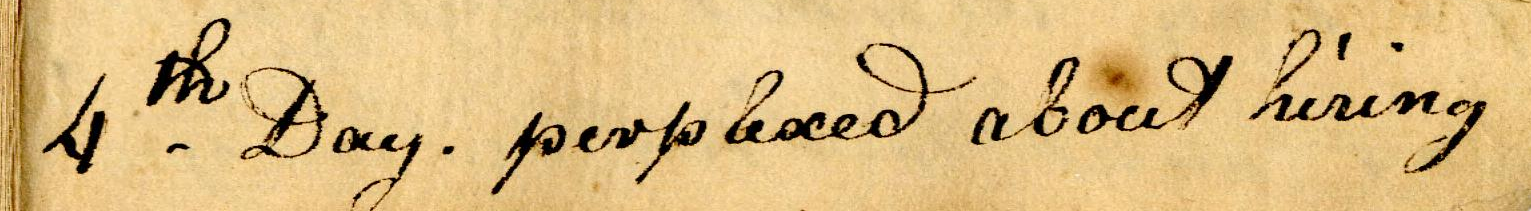4^th Day. perplexed about hiring
